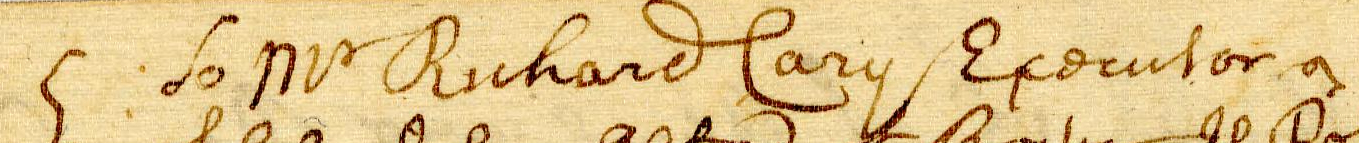To M^r Richard Cary Executor
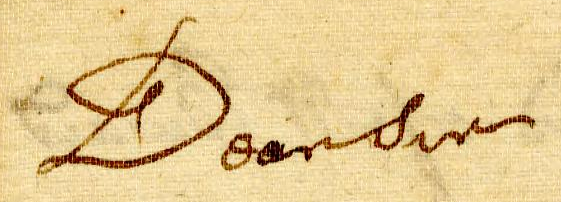Dear Sir
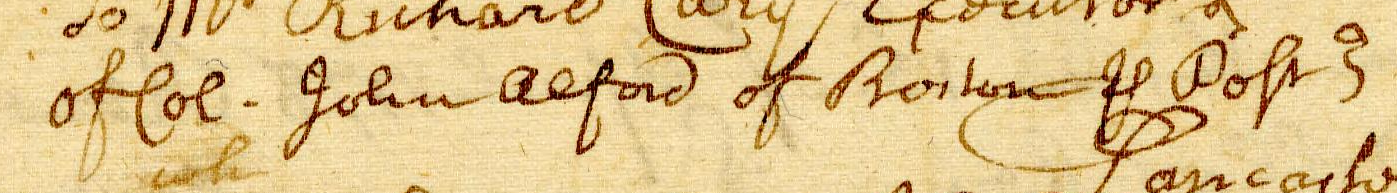of Col. John Alford of Boston per Post
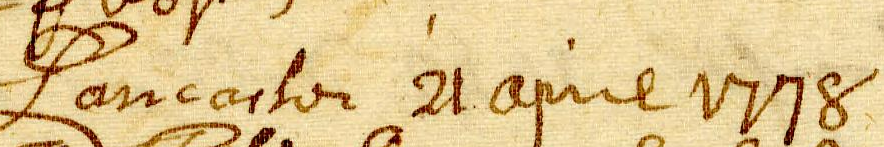Lancaster 21 April 1778
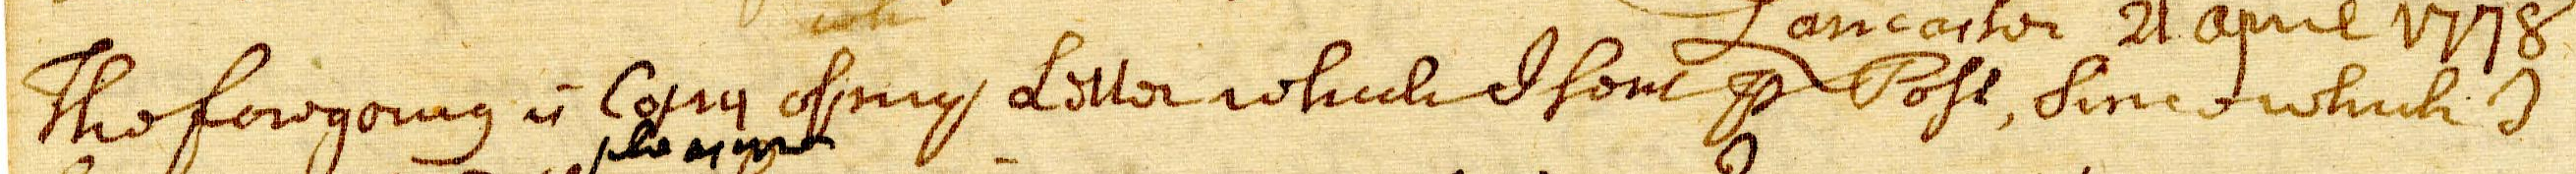The forgoing is Copy of my Letter which I sent to Post, Since which I
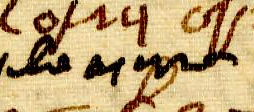pleasure
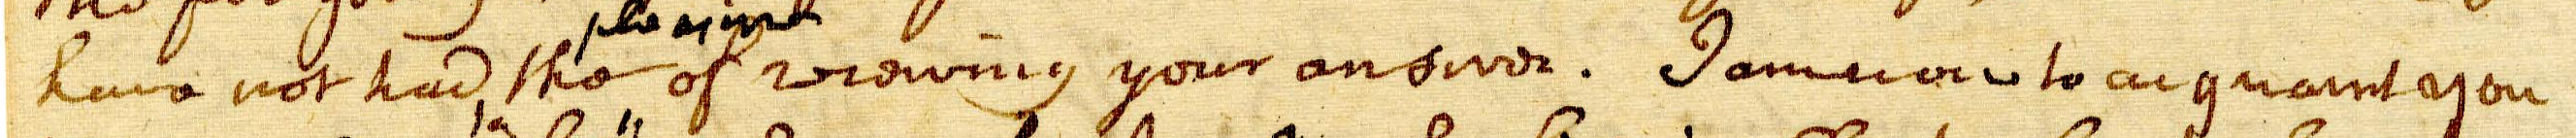have not had, the of receiving your answer. I am now to acquaint you
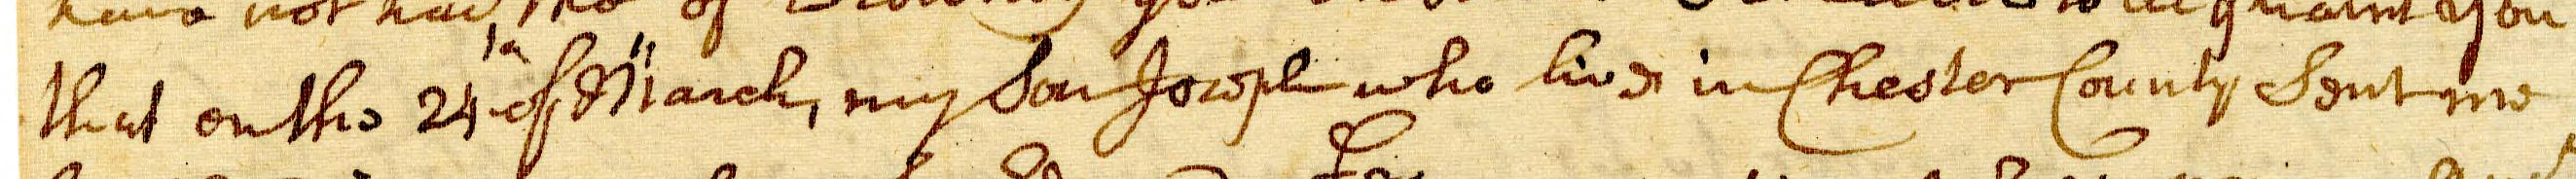that on the 24^th of March, my Son Joseph who lives in Chester County Sent me
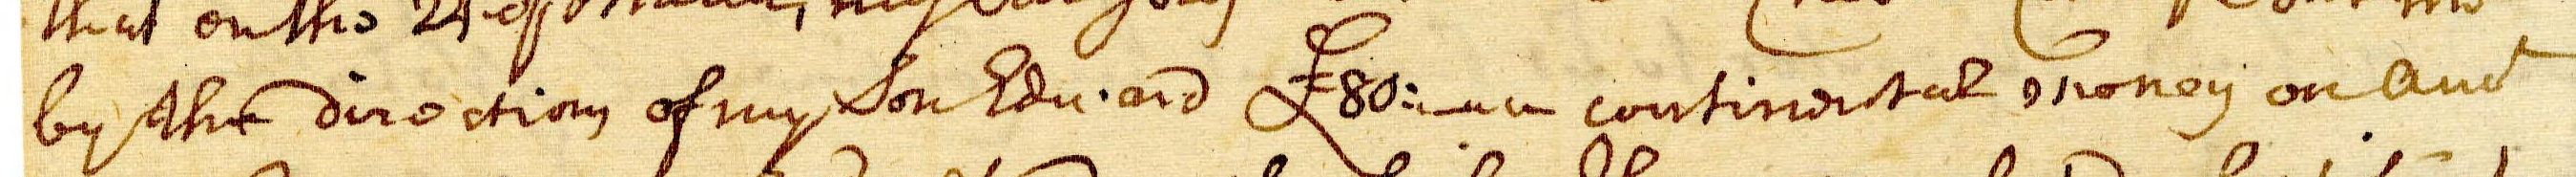by the directions of my Son Edward £80-- Continental money on Acco^t
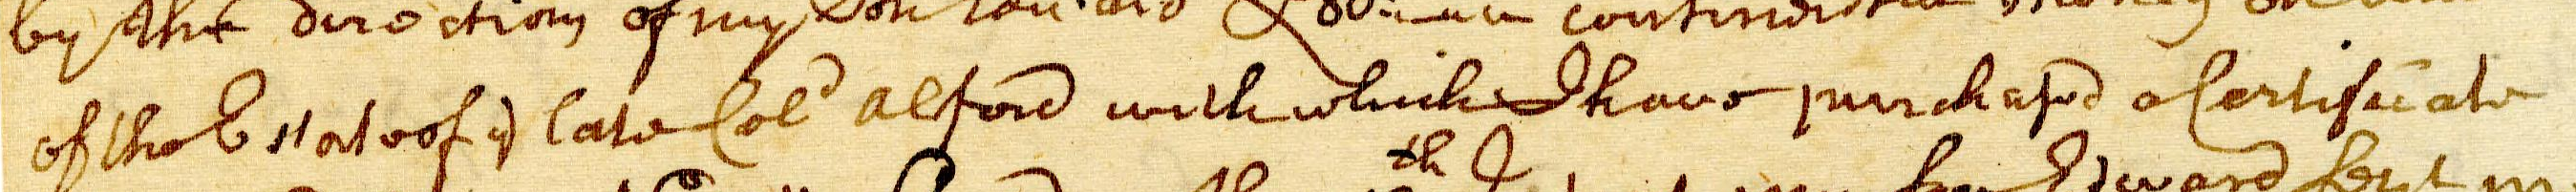of the Estate of y^e late Col^o Alford with which have purchased a Certificate
